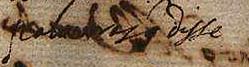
palauras q̄ disse
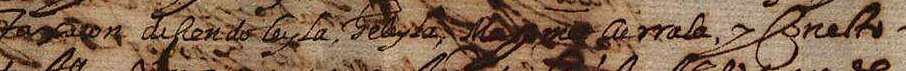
taxaron disiendo leyla, heleyla, Mahome currala, y Con esto
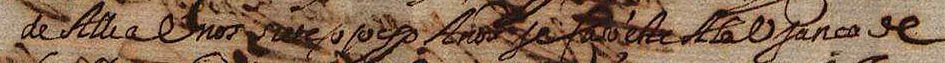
de Alli a Vnos siete o ocho Anōs se Caso este A la vsança de
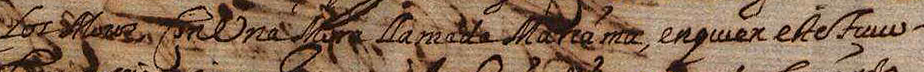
los Moros, Con Vna Mora llamada Mariama, en quien este tuuo
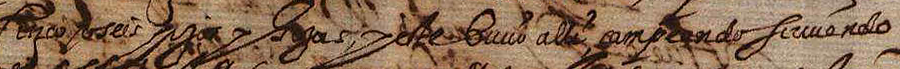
Cinco o seis hijos y hijas, y este biuio alli, campeando siruiendo
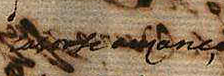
casouse a uzança
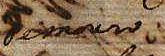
de mouro.
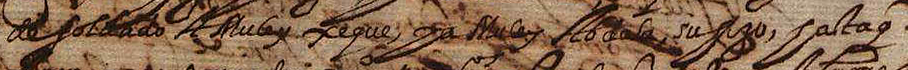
de soldado A Muley Xeque, y a Muley Abdala, su hijo, hasta q̄
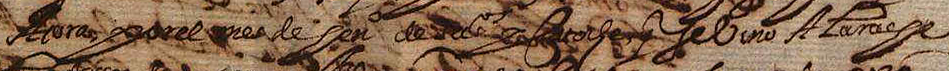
Aiora por el mes de feuo de seisos y Catorze, q̄ se vino A Larache
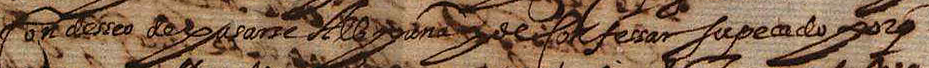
Con desseo de pasarse A espanña y de Confessar su pecado porq̄
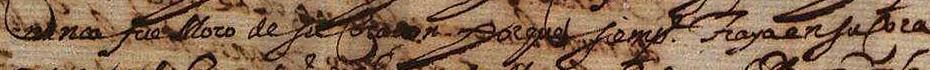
nunca fue Moro de su Coraçon porque siemp.e traya en su Cora
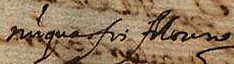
nūqua foi Mouro
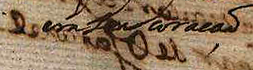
em seu coraçaõ
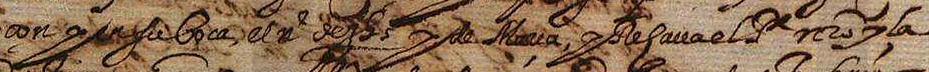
çon y en su boca, el n.e de jhs̄ y de Maria, y Rezaua el Pe nrō y la
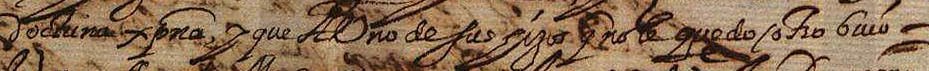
doctrina xpnā, y que A Vno de sus hijos q̄ no le que do otro biuo
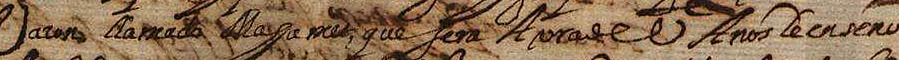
Varon llamado Mahamet, que sera Aora de Vte Anos̄ le enseño
